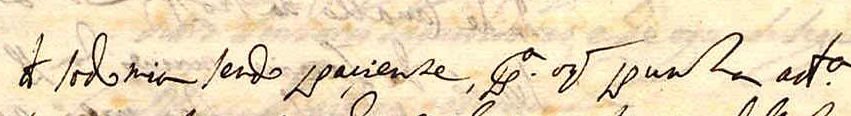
d̄ sodomia sendo paciente, p.a o q̄ punha a d̄a
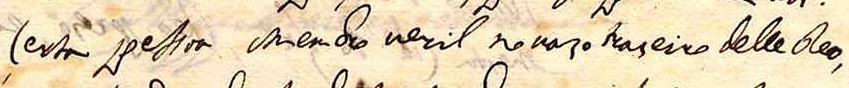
Certa pessoa o membro ueril no uazo trazeiro delle Reo,
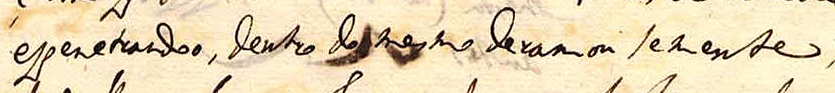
e penetrandoo, dentro do mesmo deramou semente,
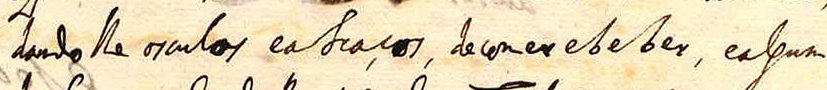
dandolhe osculos e abraços, de comer e beber, e algum
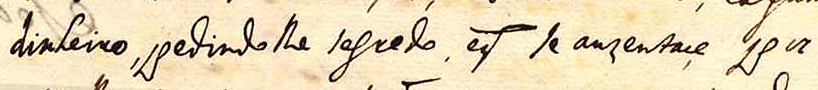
dinheiro, pedindolhe segredo, e q̄ se auzentace por
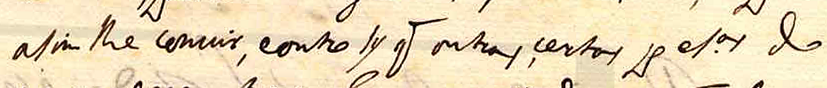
asim lhe conuir, e outrosy q̄ outras certas pes.as do
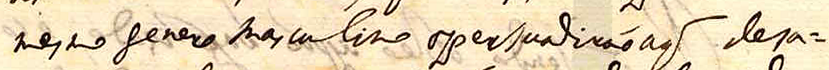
mesmo genero masculino o persuadiraõ a q̄ deza
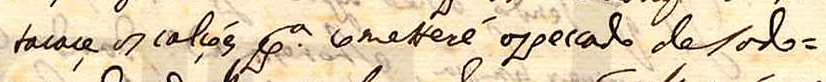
tacace os calçoẽs p.a cometterē o peccado de sodo
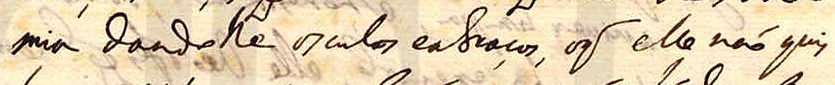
mia dandolhe osculos e abraços, o q̄ elle naõ quis
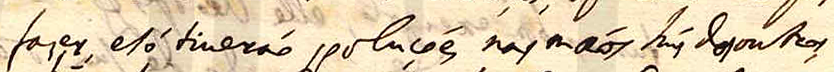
fazer, e só tiueraõ poluçoẽs nas maõs hūs dos outros
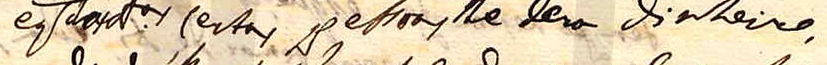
e q̄ das d̄.as certas pessoas lhe dera dinheiro,
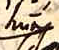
huās
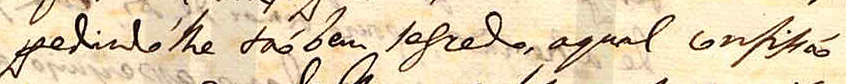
pedindolhe taõbem segredo, a qual confissaõ
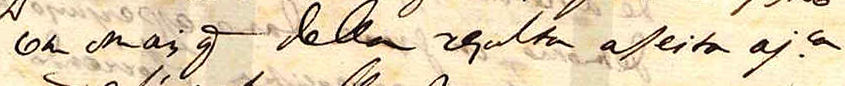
com mais q̄ della rezulta aseita a j.ca
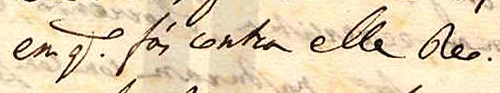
emqto fas contra elle Reo.
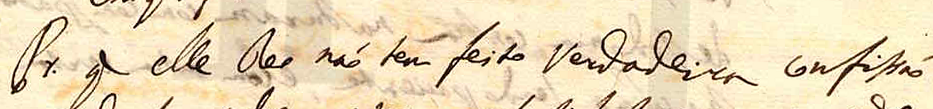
Pr. q̄ elle Reo naõ tem feito verdadeira confissaõ
